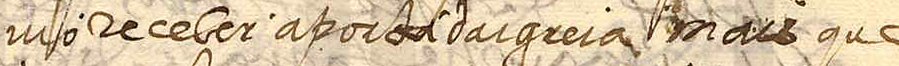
uio receber a porta da igreia mais que
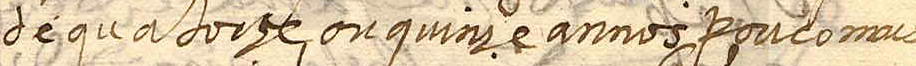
de quatorze ou quinze annos pouco mais
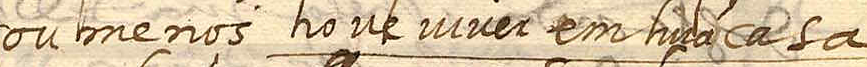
ou menos ho ue uiuer em huā casa
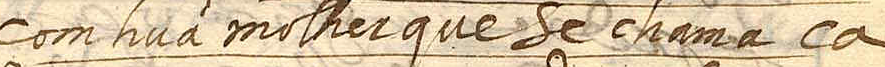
com huā molher que se chama ca
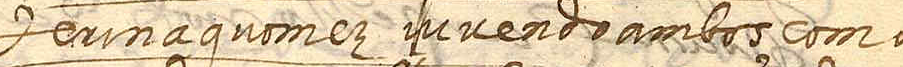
terina guomez uiuendo ambos como
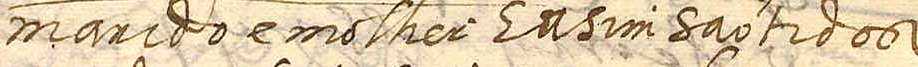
marido e molher E assim saõ tidos
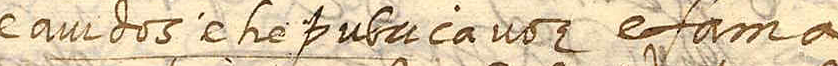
e auidos e he pubrica uoz e fama
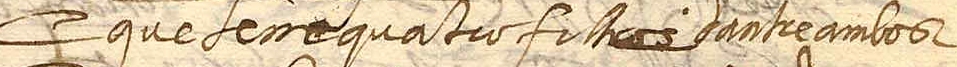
e que tem quatro filhos dantre ambos
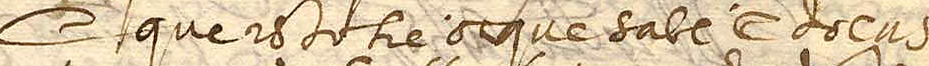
e que isto he o que sabe e do cus
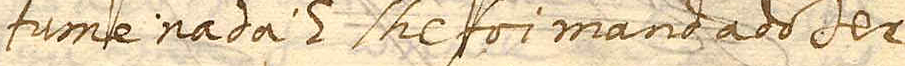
tume nada E lhe foi mandado ter
